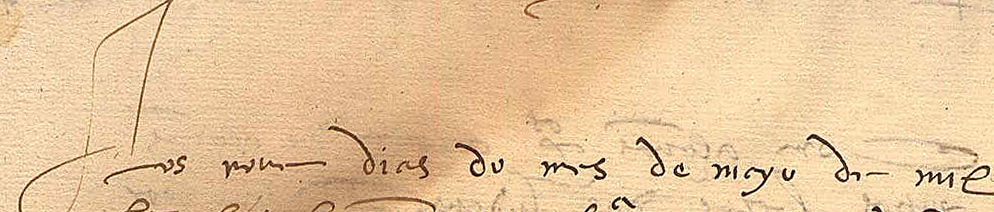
Aos noue dias do mes de mayo de mil
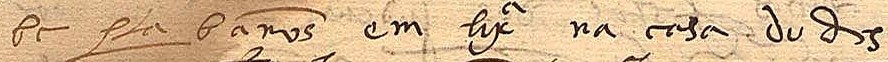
bc Lta b a̅nos em lixa na casa do des
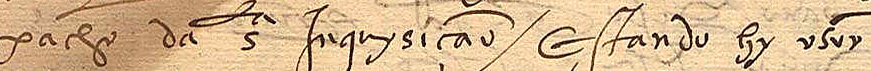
pacho da sta Jnquysição / Estando hy o s̅or
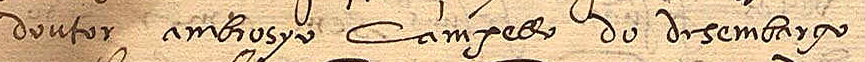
doutor ambrosyo Campello do desembargo
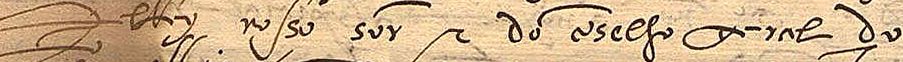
del Rey nosso so̅r e do c̅oselho geral do
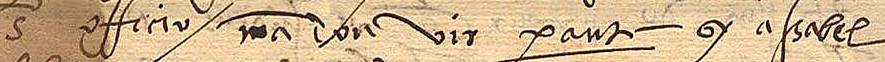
sto officio / m̅adou vir ꝑante sy a Jsabel
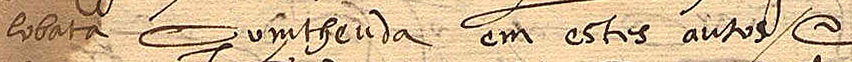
lobata Comtheuda em estes autos / e
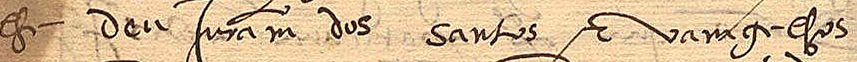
lhe deu Juramto dos santos evamgelhos
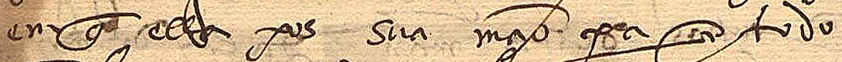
em q̅ ella pos sua mão ꝑa e̅ todo
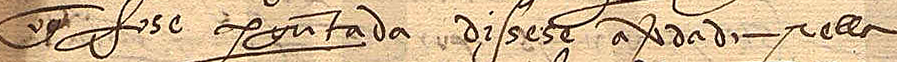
o q̅ fose ꝑ gu̅tada dissese a ꝟdade e ella
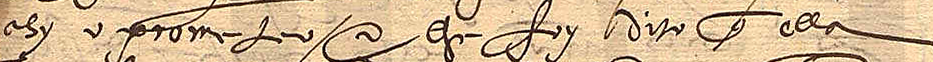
asy o prometeo / e lhe foy dito q̅ ella
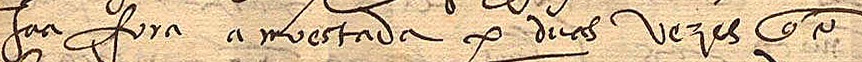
Jaa fora amoestada ꝑ duas vezes q̅ c̅o
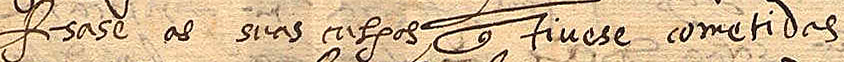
fesase as suas culpas q̅ tiuese cometidas
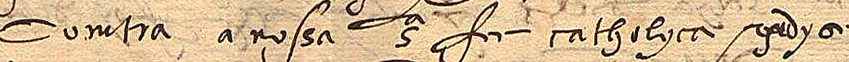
Comtra a nossa sta fee catholyca e pedyse
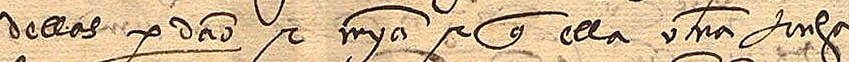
dellas ꝑdão e my̅a e q̅ ella o n̅a tinha
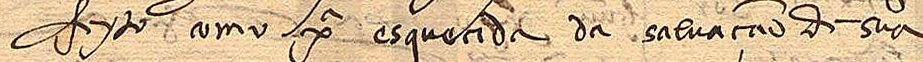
feyto como pa esquecida da saluação de sua
